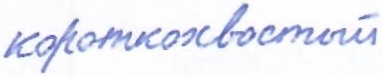короткохвостый
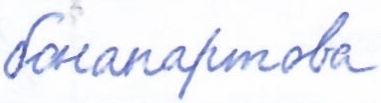бонапартова
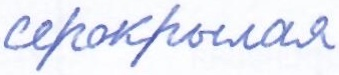серокрылая
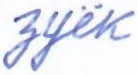зуёк
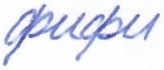фифи
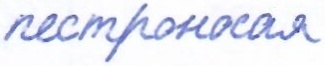пестроносая
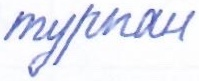турпан
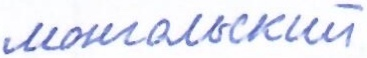монгольский
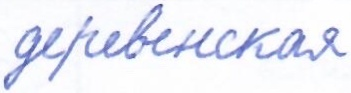деревенская
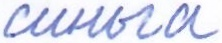синьга
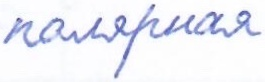полярная
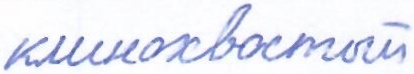клинохвостый
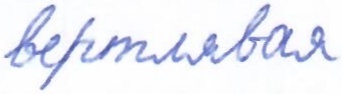вертлявая
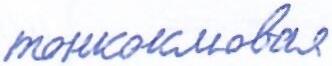тонкоклювая
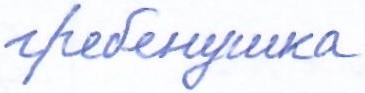гребенушка
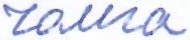чомга
